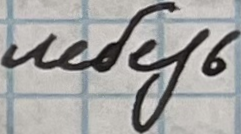лебедь
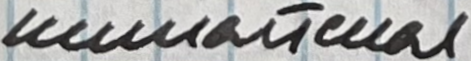китайская
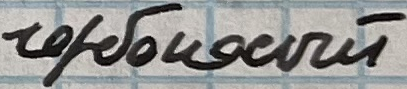горбоносый
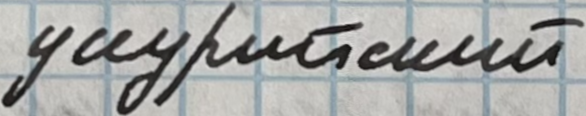уссурийский
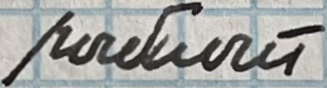рыбный
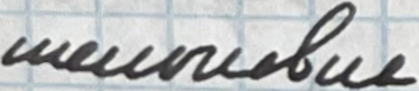теньковка
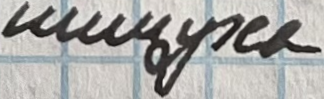пищуха
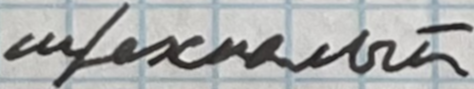трехпалый
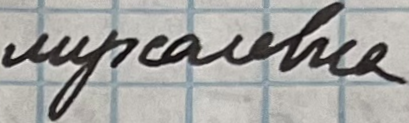мухоловка
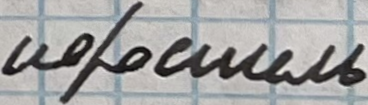коростель
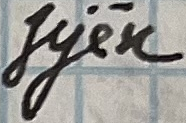зуёк
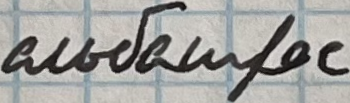альбатрос
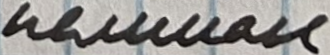пеликан
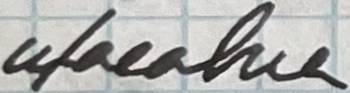красавка
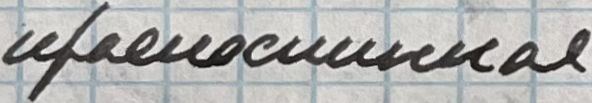красноспинная
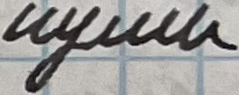кулик
